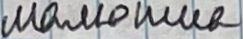малютка
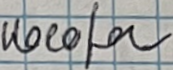носорог
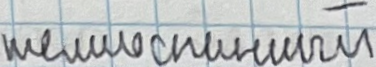темноспинный
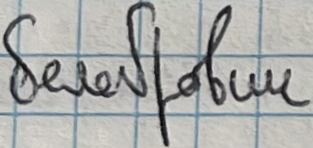белобровик
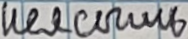неясыть
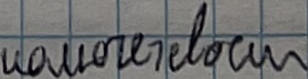колючехвост
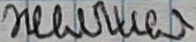желчная
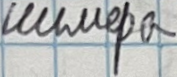нимфа
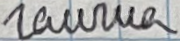гаичка
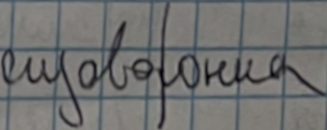сизоворонка
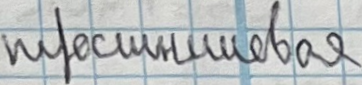тростниковая
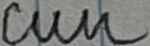сип
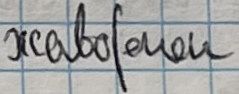жаворонок
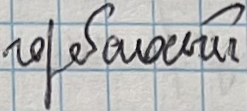горбоносый
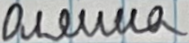оляпка
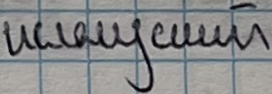исландский
